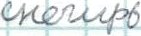снегирь
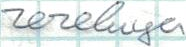чечевица
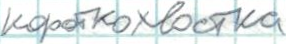короткохвостка
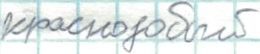краснозобый
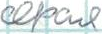серая
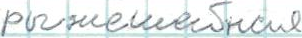рыжешейная
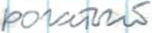рогатый
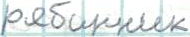рябинник
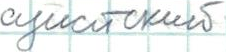азиатский
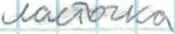ласточка
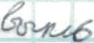выпь
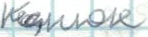канюк
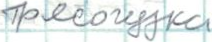трясогузка
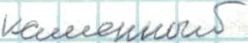каменный
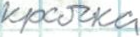крачка
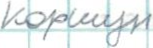коршун
